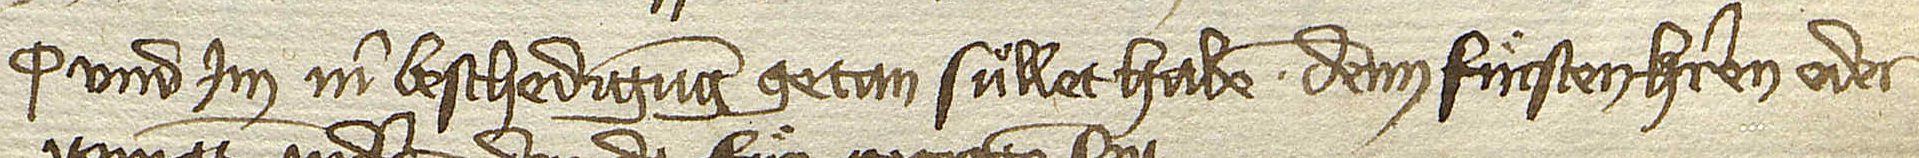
vnd Im m* beſchedigug* getan ſüllet habe* . denn fürſten h*ren oder
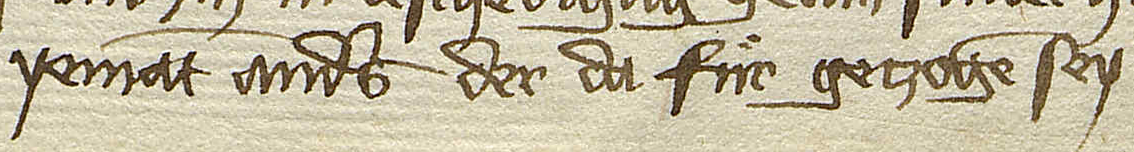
yemat* and*s der da für gecʒoge* ſey
